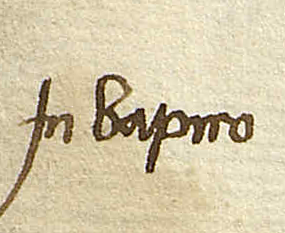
In bapiro
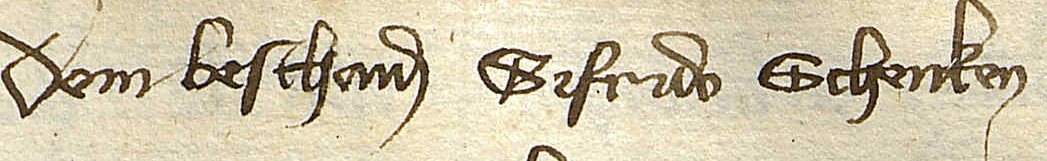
Dem beſchaid* Sifrido Schenken
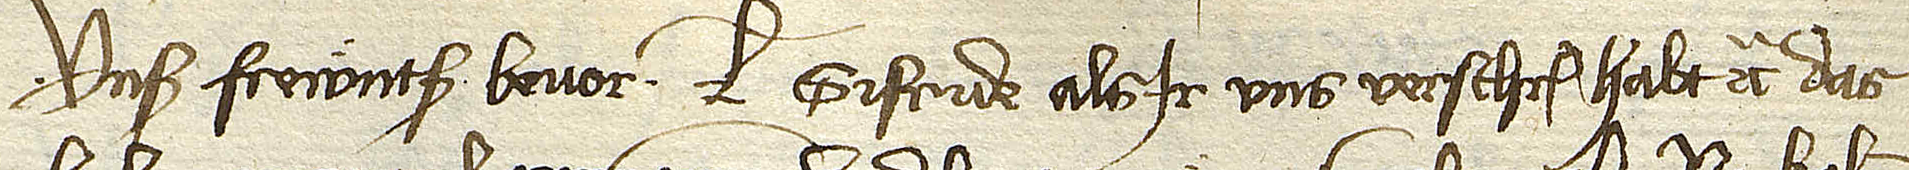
Vnſ* frewntſ* beuor . L* Sifride als Ir vns verſchr* habt ec* das
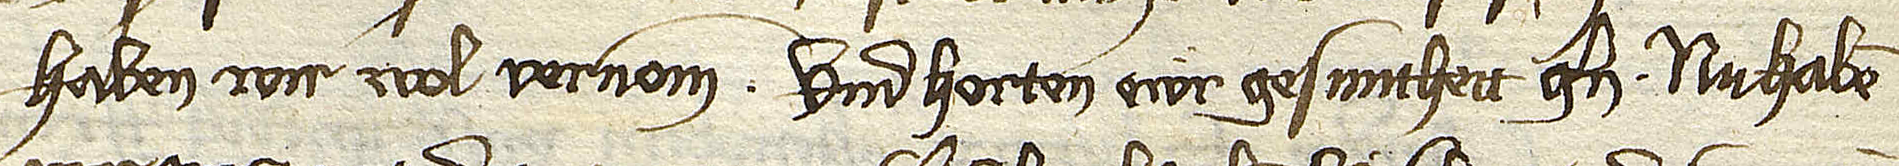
haben wir wol vernom* . Vnd horen ewr geſuntheit g*n . Nu habe*
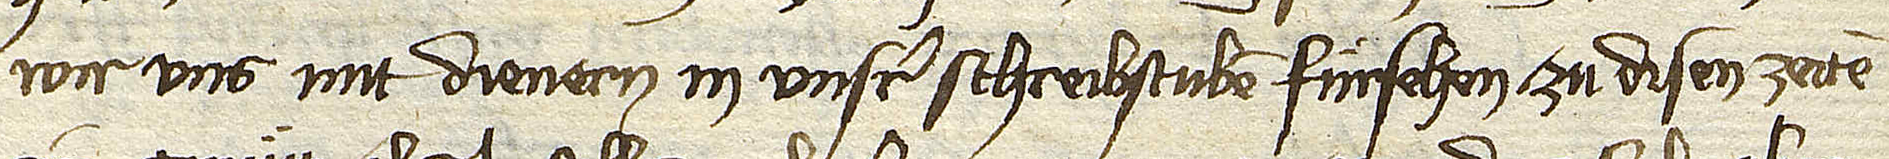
wir vns mit dienern in vnſr* ſchreibſtube* fürſehen / ʒu diſen ʒeite*
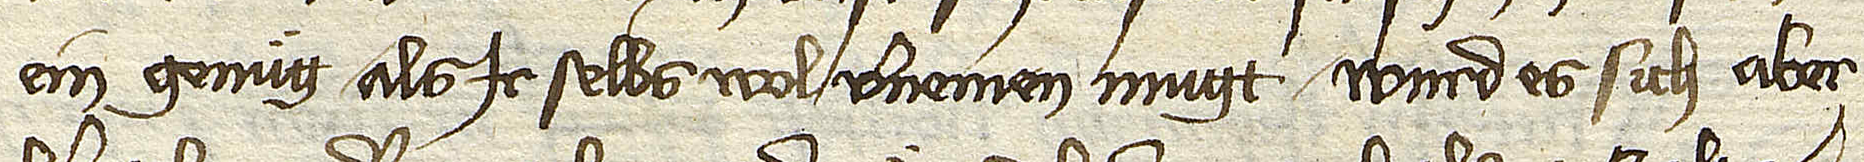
ein genüg / als Ir ſelbs wol v*nemen mugt / wurd es ſich aber
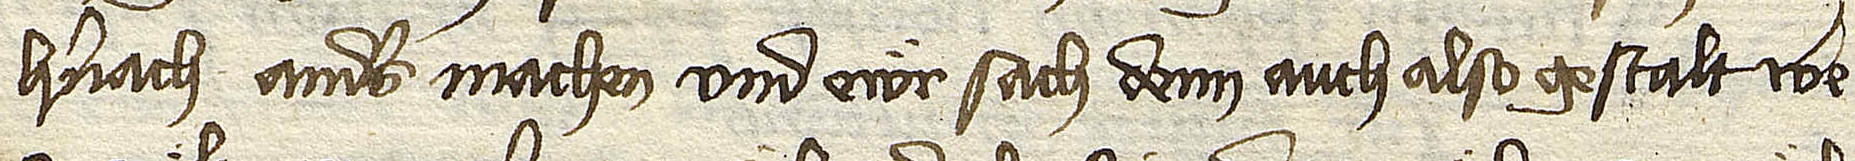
h*nach and*s machen vnd ewr ſach denn auch alſo geſtalt w*e
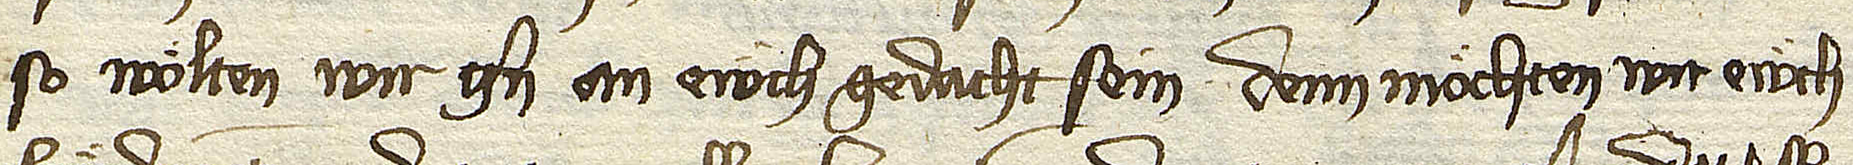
ſo wölten wir g*n an ewch gedacht ſein . denn möchten wir ewch
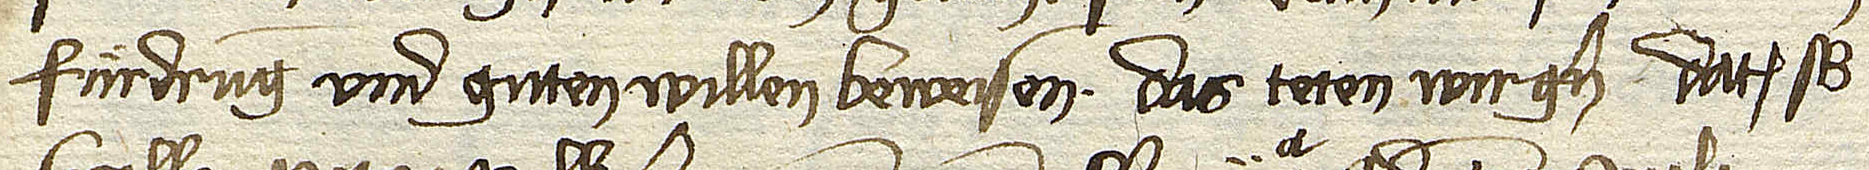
fürdrug* vnd guten willen beweiſen . das teten wir g*n dat* ſB
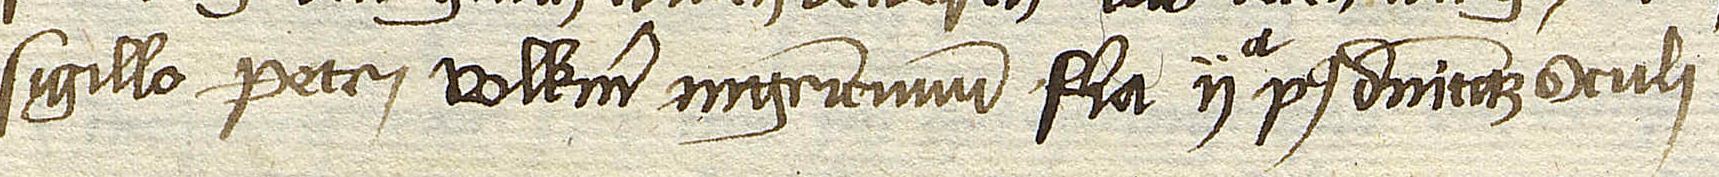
ſigillo Petri volkm* mgri*ciuiu* fi*a ii* p* dnita* Oculi
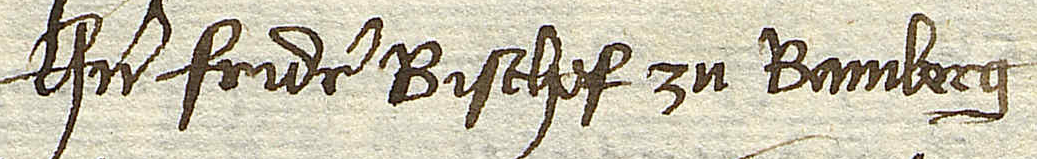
Hn* Fridr* Biſchof ʒu Bamberg
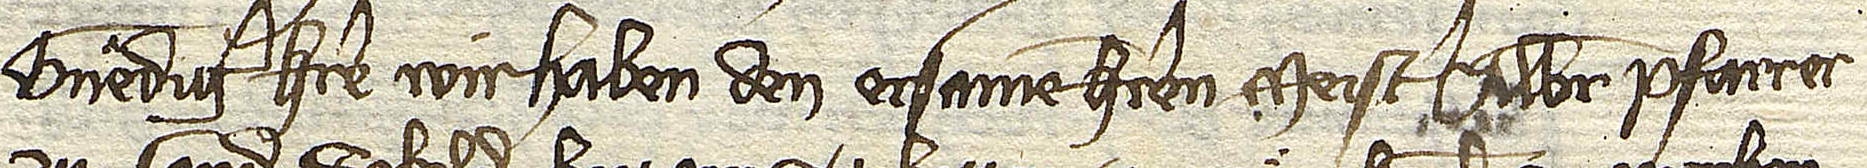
Gnëdig* Hr*e wir haben den erſame* hre*n Meiſt* Albr* Pfarrer
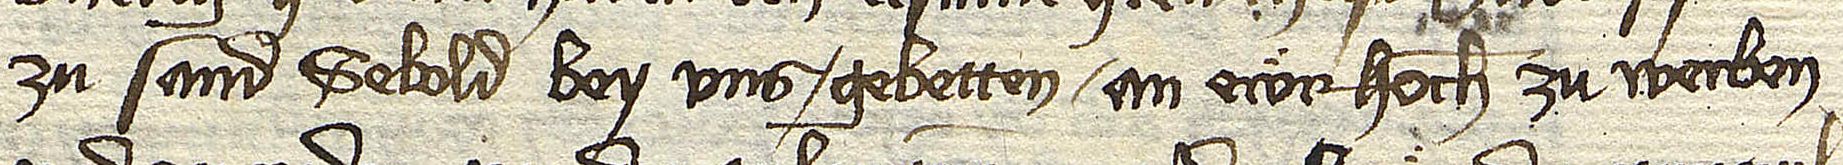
ʒu ſand Sebold bey vns / gebetten / an ewr Hoch* ʒu werben
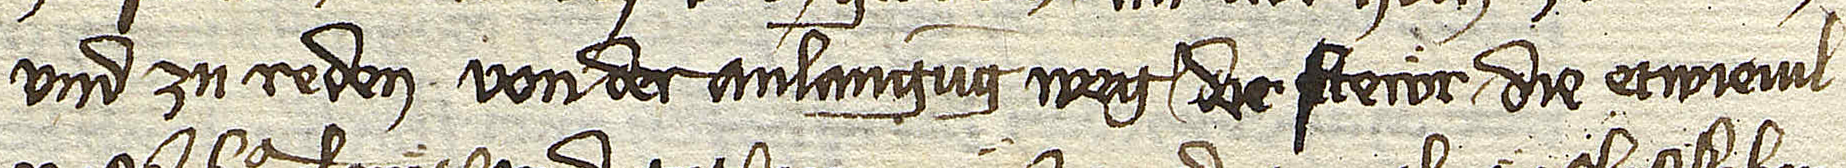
vnd ʒu reden von der anlagug* weg* der ſtewr / die etwieuil
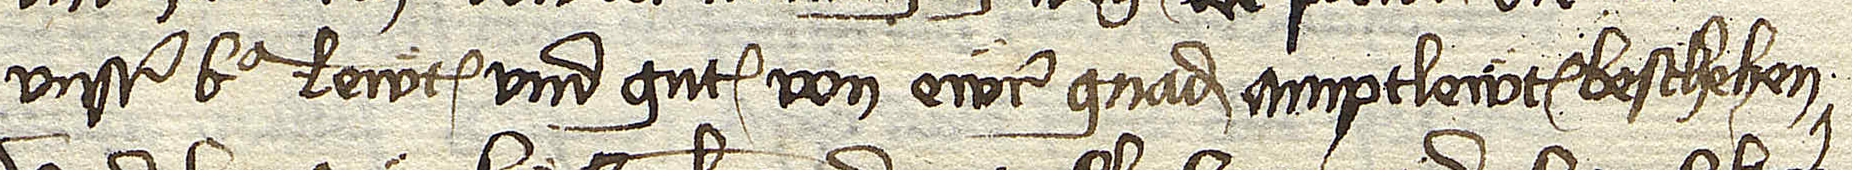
vnſr* b* lewt* vnd gut* von ewr* gnad* amptlewt* beſchehen
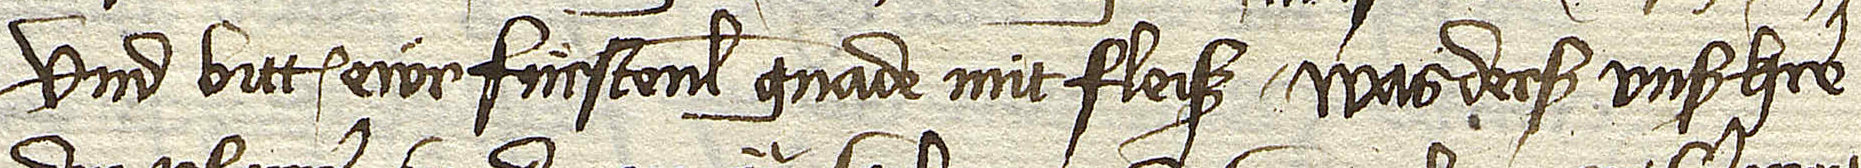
Vnd bitt* ewr fürſtenl* gnade mit fleiſʒ / was derſ* vnſ* hr*e
